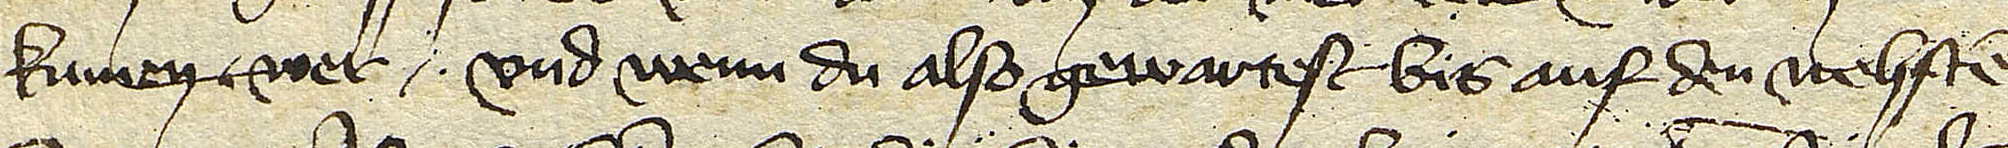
kumen / wer / . vnd wenn du alſo gewarteſt bis auf den nehſte*
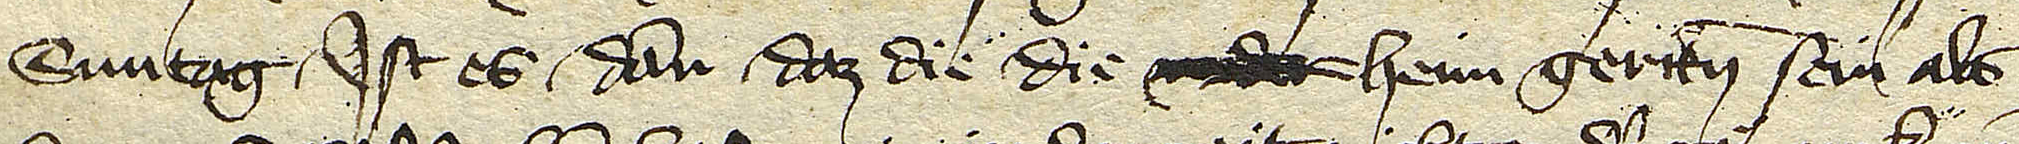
Suntag / Iſt es / da*n / daʒ die / die wider heim geritn* ſein als
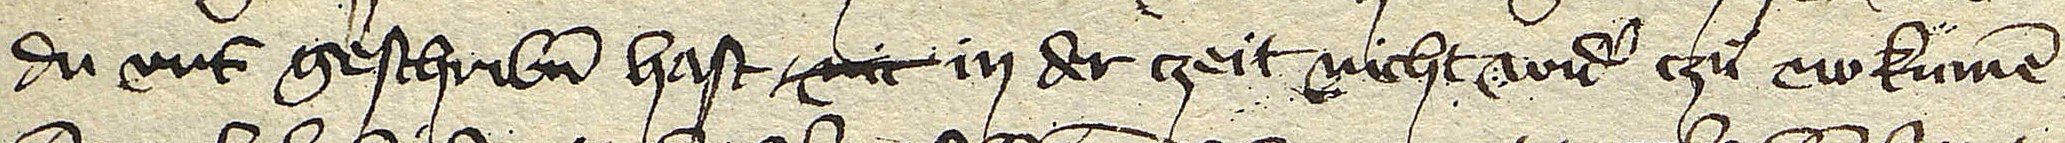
du vns geſchribn* haſt / nic in der cʒeit nicht wid* cʒü ew kume*
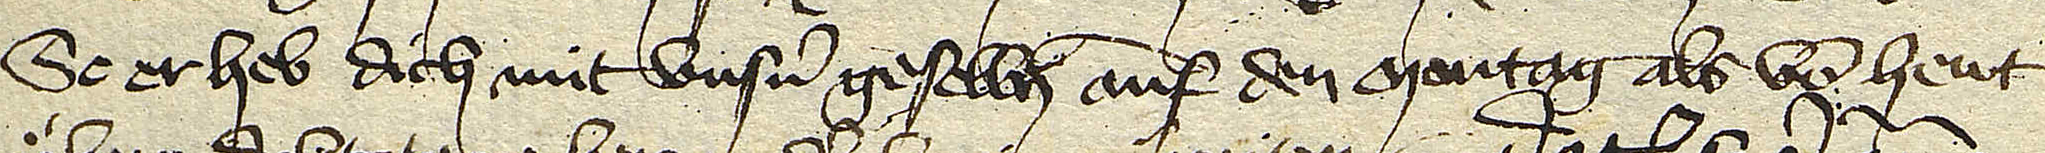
So er heb dich mit vnſn* geſelln* auf den Montag als vo* hewt
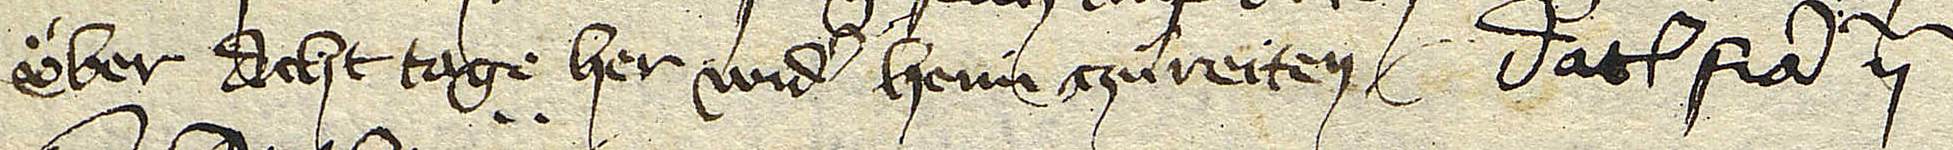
v̈ber Acht tage her wid* heim cʒü reiten / Dat* fia* ii*
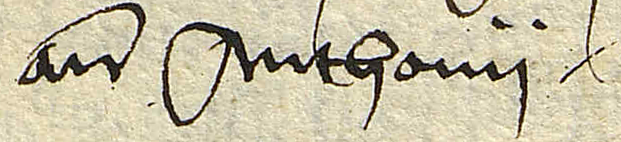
an* Anthonii /
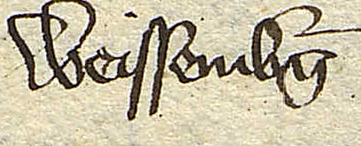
Weiſſemb*g
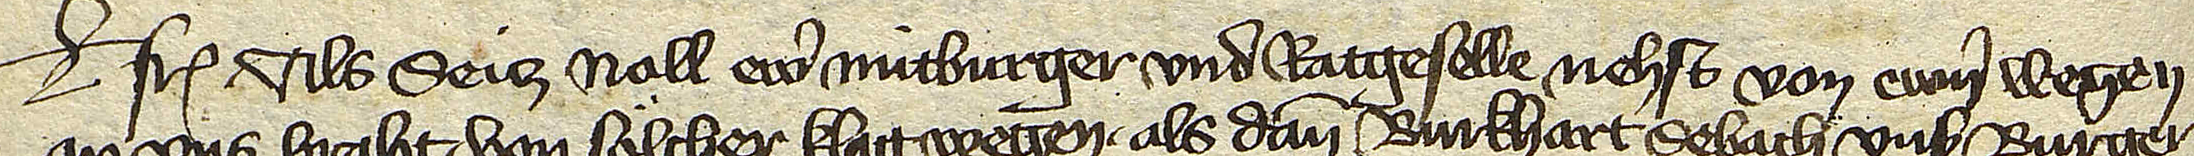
L* fr* / Als Seicʒ Noll ew* mitburger vnd Ratgeſelle nehſt von ewn* wegen
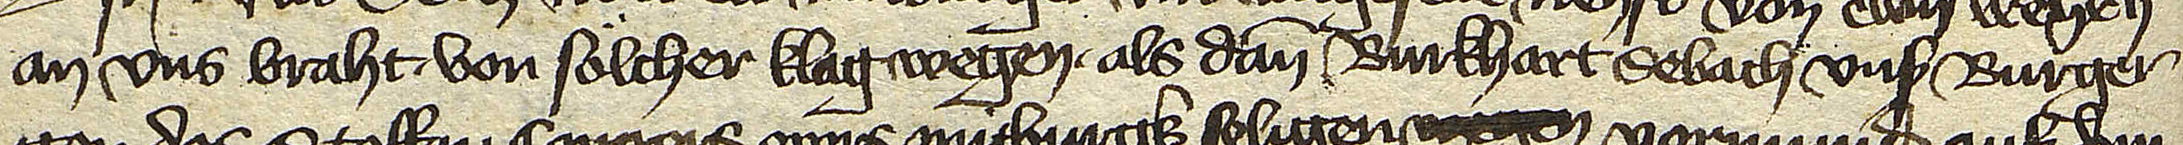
an vns braht / von ſölcher klag wegen / als dan* Burkhart Sebach vnſ* Burger
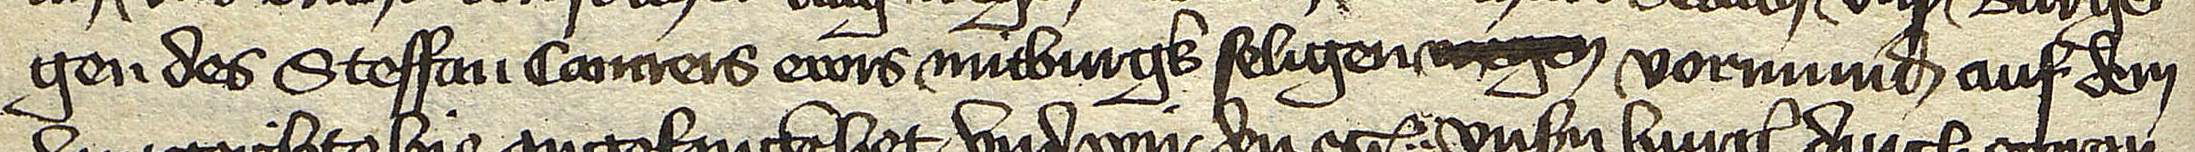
gen des Steffan Camrers ewrs mitburgs* ſeligen wegen vormund* auf dem
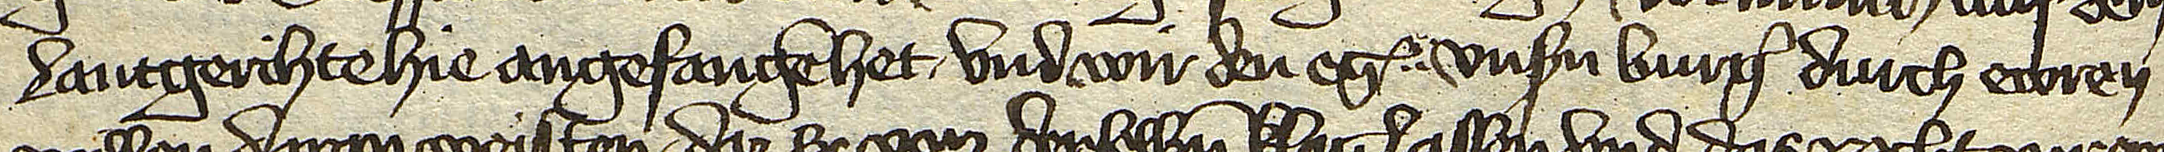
lantgerihte hie angefange* het / Vnd wir den eg* ~ vnſ*n burg* durch ewren
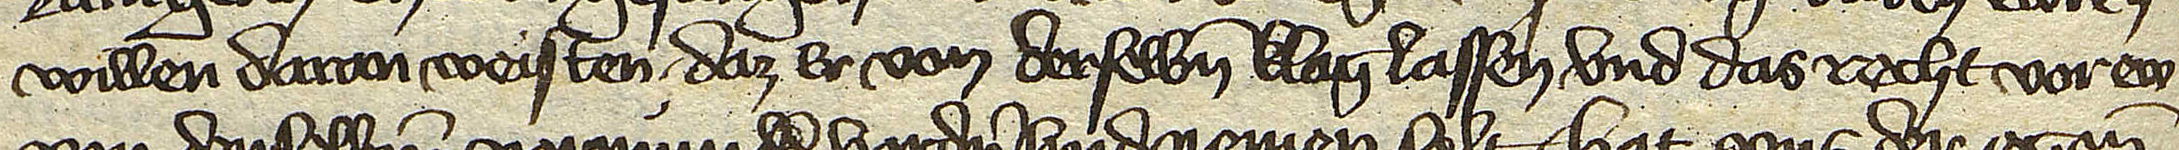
willen daran weiſten / daʒ Er von derſelbn* klag laſſen vnd das recht vor ew
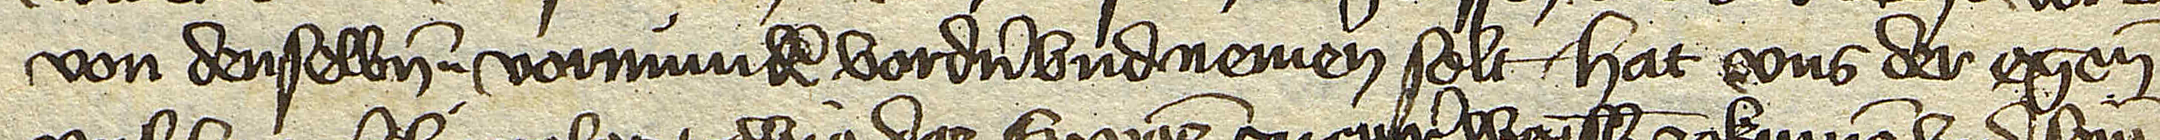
von denſelbn* ~ vormünd* vordn* vnd nemen ſolt / hat vns der egen*
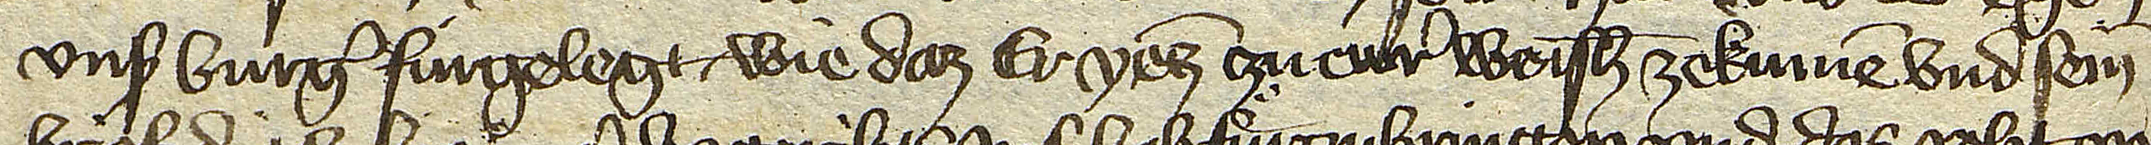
vnſ* burg* fürgelegt / wie daʒ Er yecʒ* cʒu ewr* weiſh* cʒekume* vnd ſein*
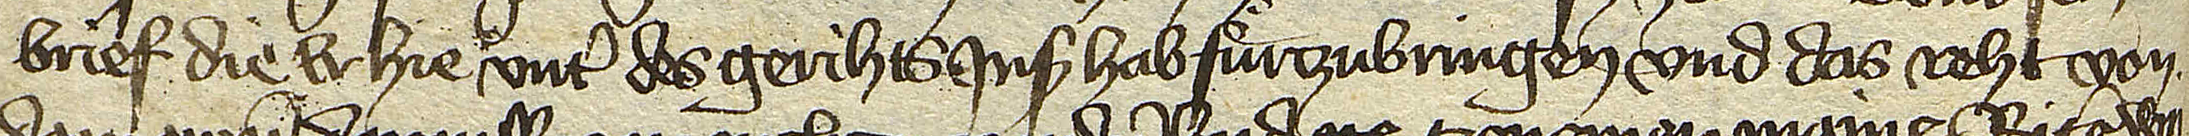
brief die Er hie vnt* des gerihts Inſ* hab fürcʒubringen vnd das reht von
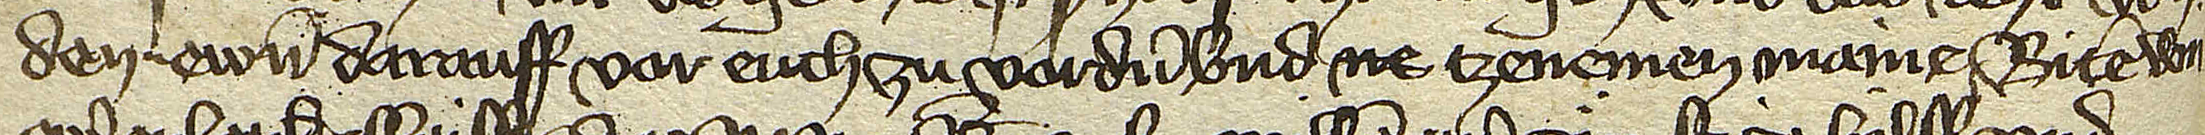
den ~ ewn* darauff vor euch cʒu vordn* vnd ne cʒenemen maine / Bite* wir
